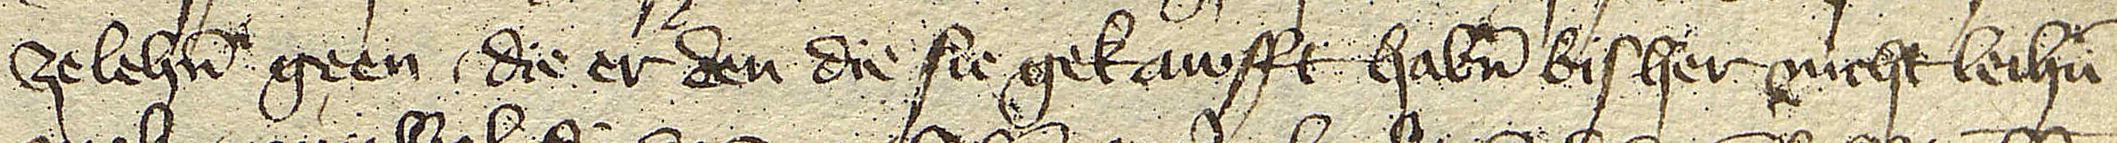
cʒelehn* geen / die er den die ſie gekawfft habn* biſher nicht leihn*
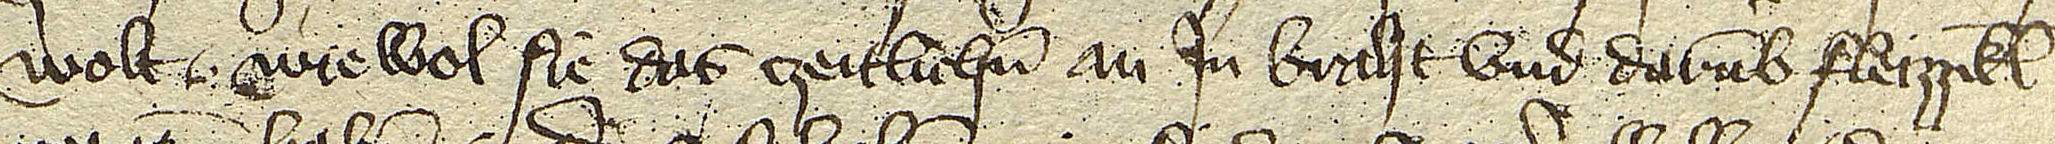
wolt / wie wol ſie das cʒeitlichn* an In braht vnd darub* fleiʒʒikl*
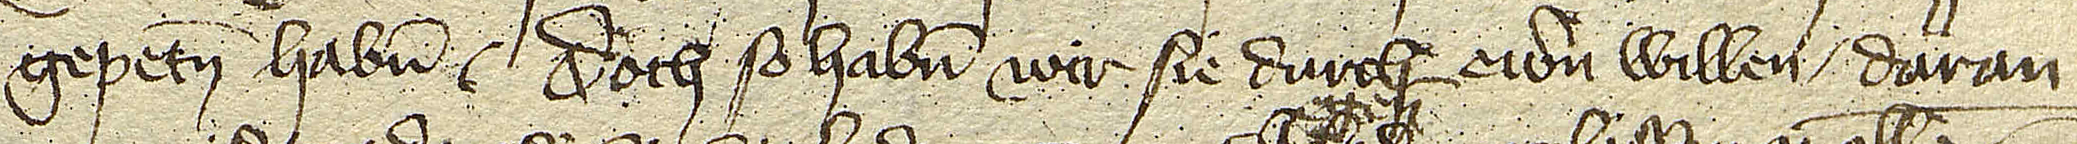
gepetn* habn* / Doch ſo habn* wir ſie durch ew*n willen / daran
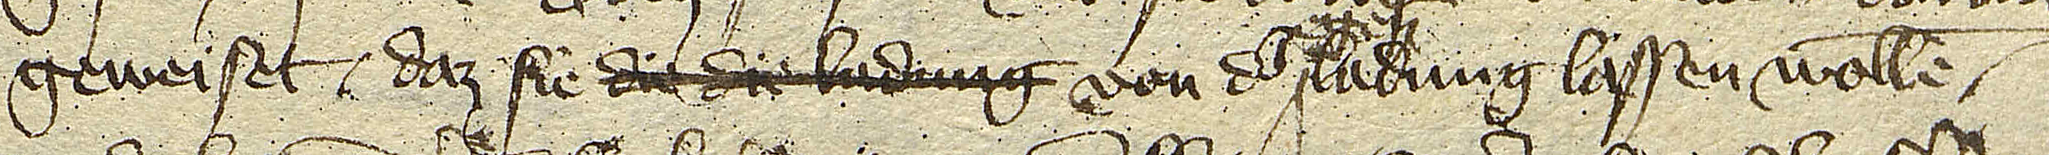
geweiſet / daʒ ſie die die ladung von d* ladung laſſen wolle* /
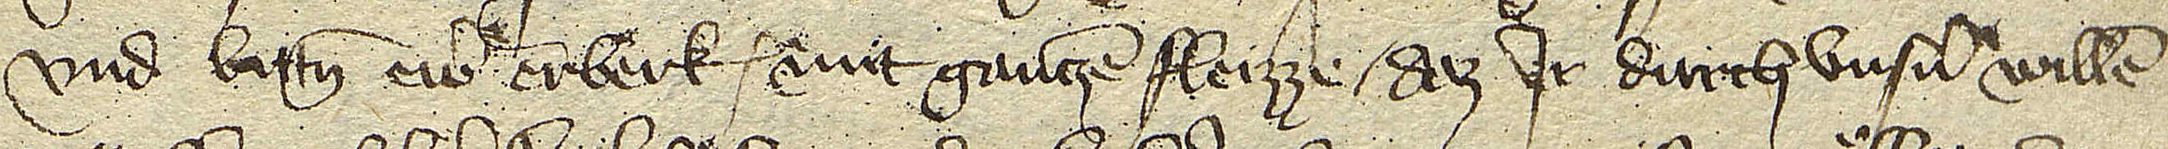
vnd bittn* ew* erberk* mit gancʒe* fleiʒʒe / daʒ Ir durch vnſn* wille*
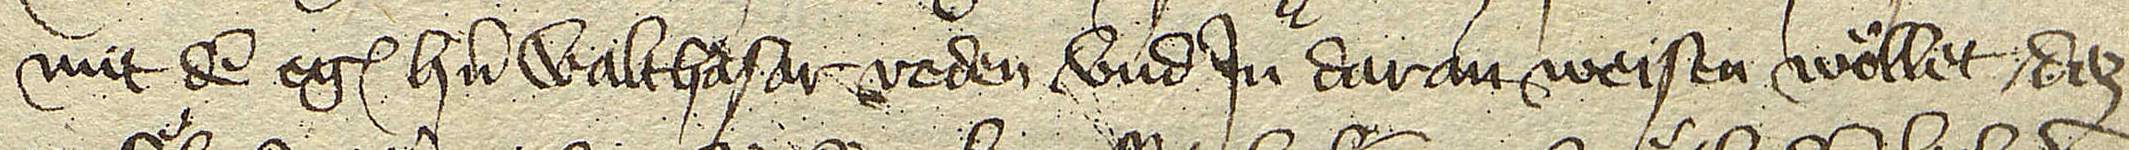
mit d* eg* hn* Walthaſar reden / vnd In daran weiſen wöllet / daʒ
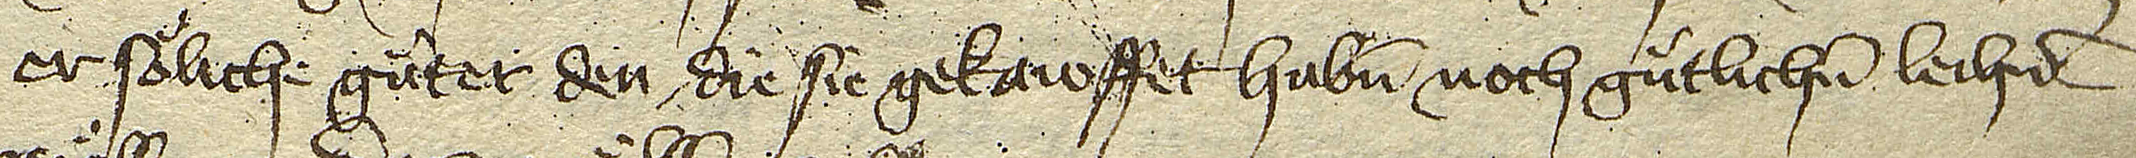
er ſölich güter den die ſie gekawffet habn* noch gütlichn* leihn*
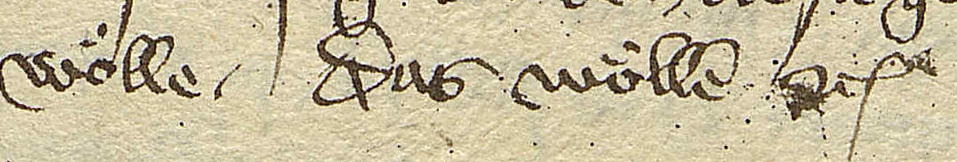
wölle* / Das wölle* ec*
